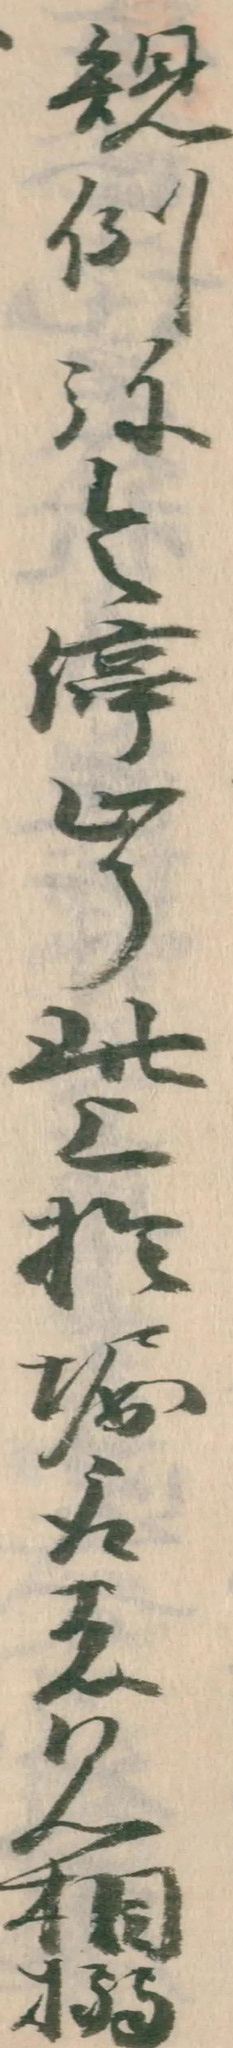規例弥令停止了此上於掘取者見相搦
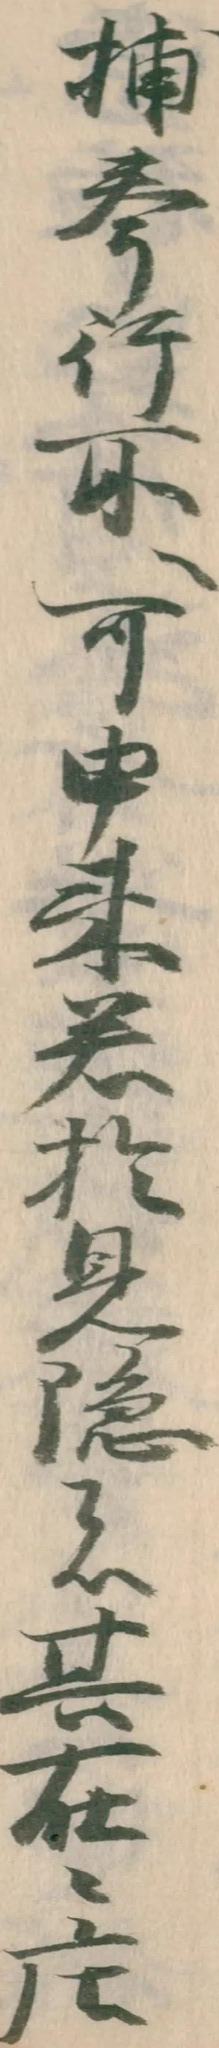捕奉行所へ可申来若於見隠者其在々庄
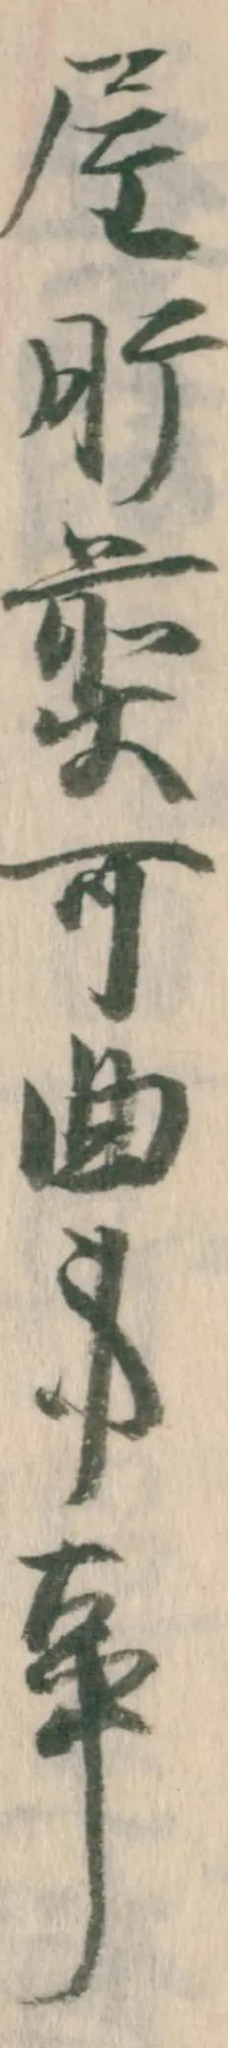屋肝煎可曲事事
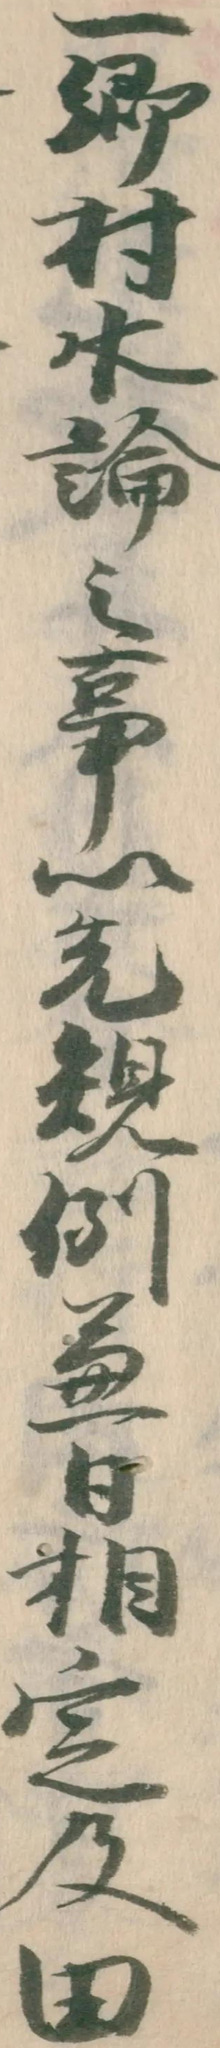一郷村水論之事以先規例兼日相定及田
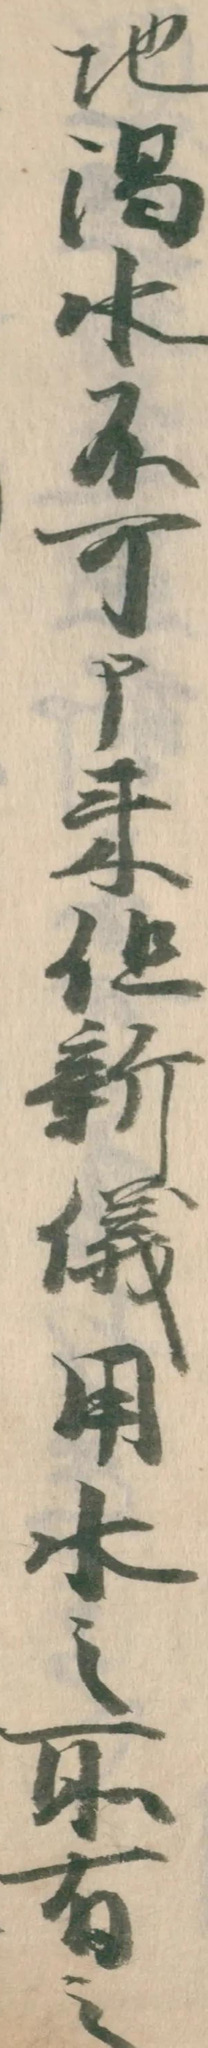地渇水不可申来但新儀用水之所有之
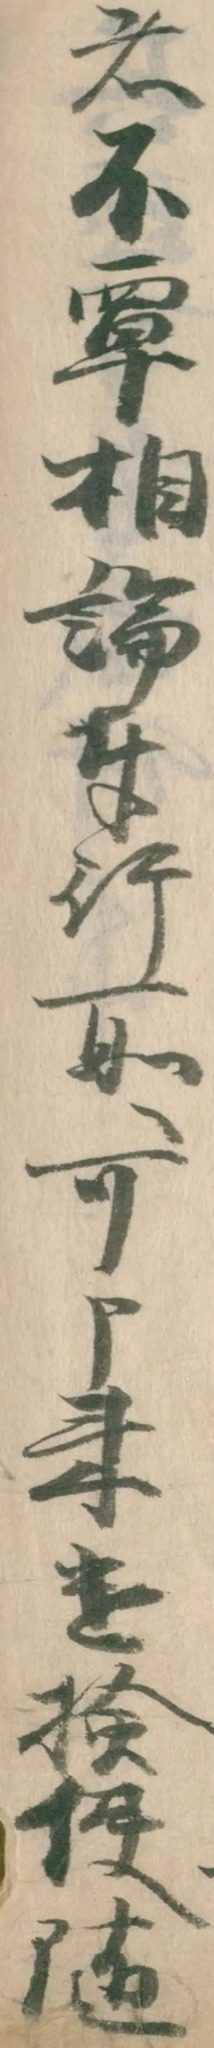者不覃相論奉行所へ可申来遣検使随
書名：賀茂社記録. 第1冊
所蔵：国立国会図書館 National Diet Library, JAPAN
